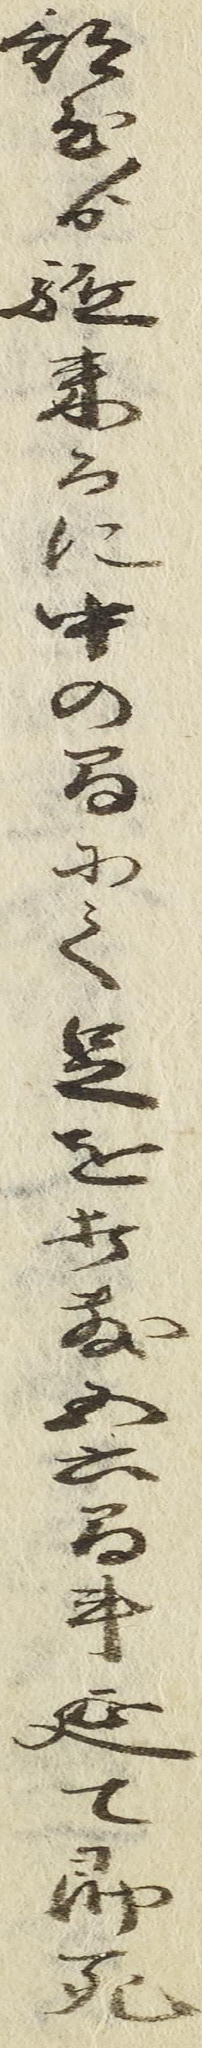部屋ゟ駈来るに中の間にて足を打敷五六間計延て即死
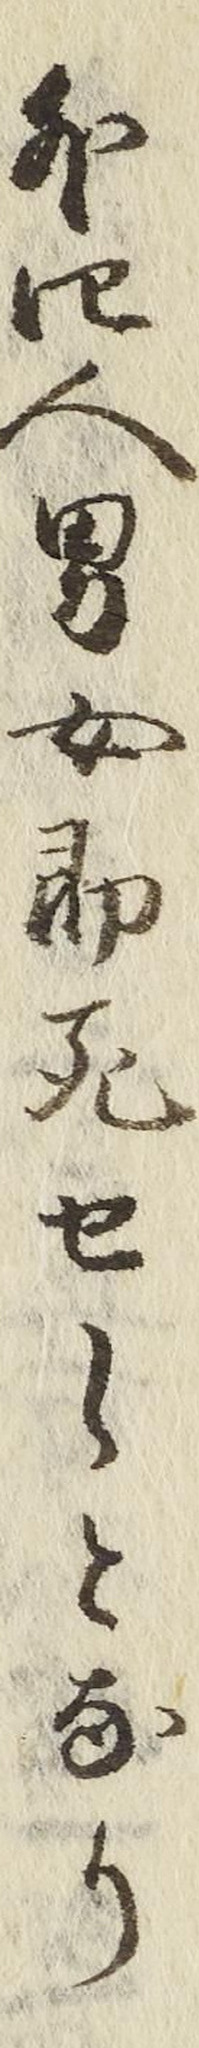外四人男女即死せしとなり
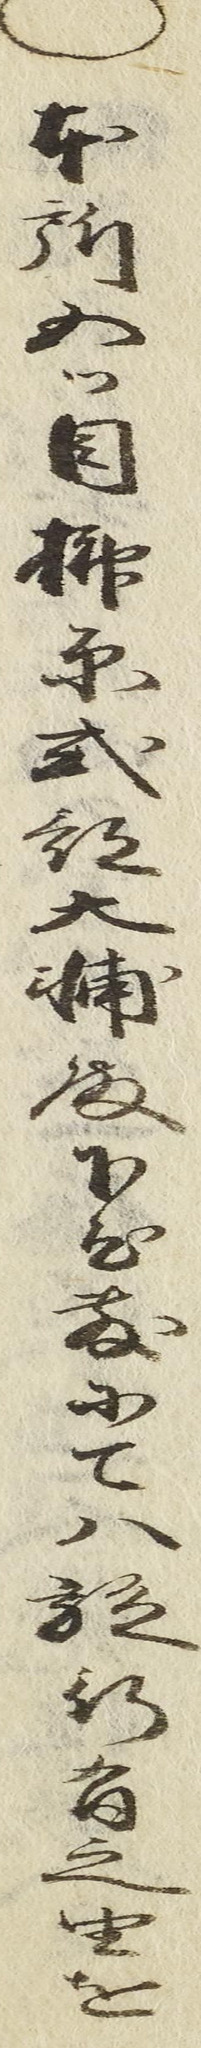○本所五ツ目榊原式部大輔殿下屋敷にては施行有之由を
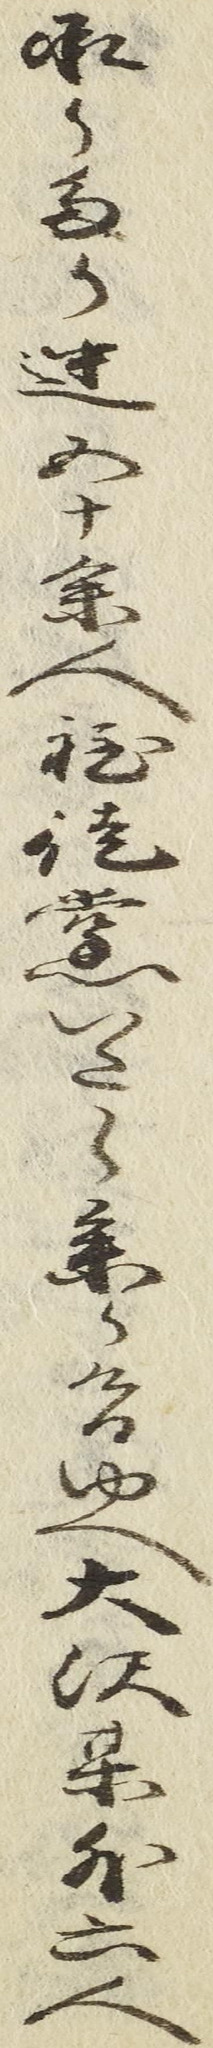承りたり迚五十余人程徒党いたし参りけるゆへ大沢某外六人
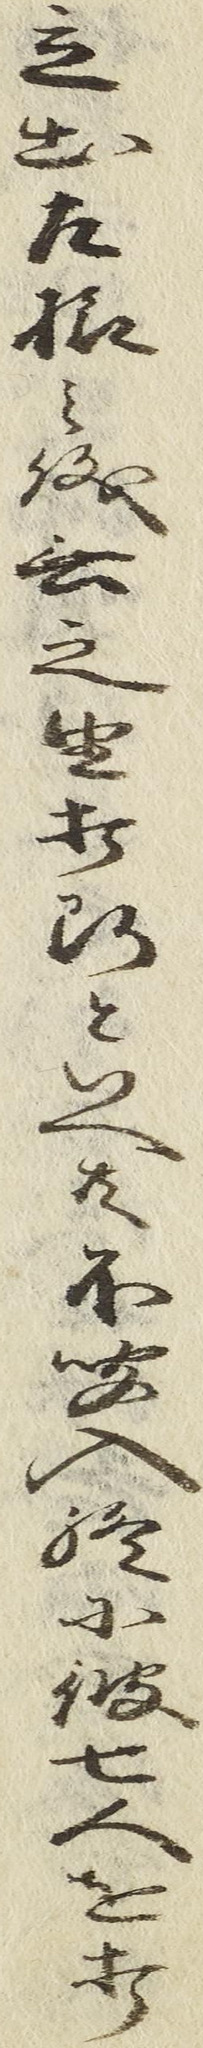立出左様之儀無之由打断といへ共不聞入終に彼七人を打
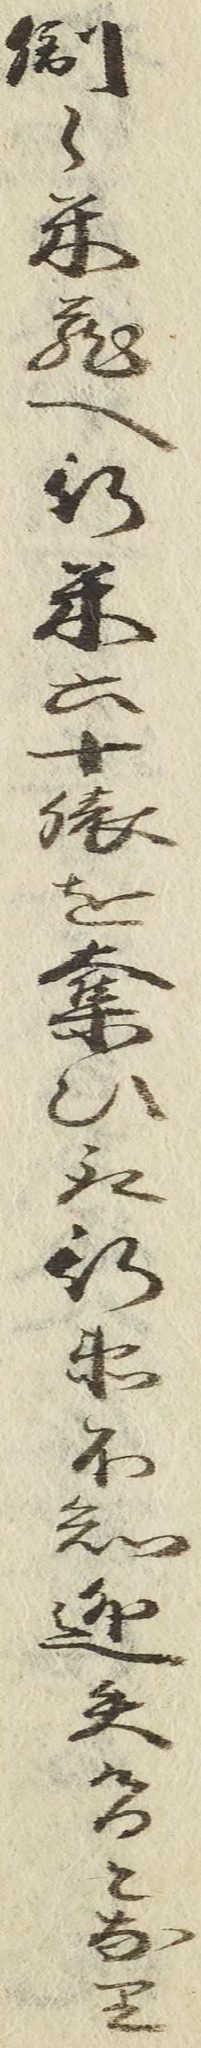倒し米蔵へ行米六十俵を奪ひ取行衛不知逃失けるとなり
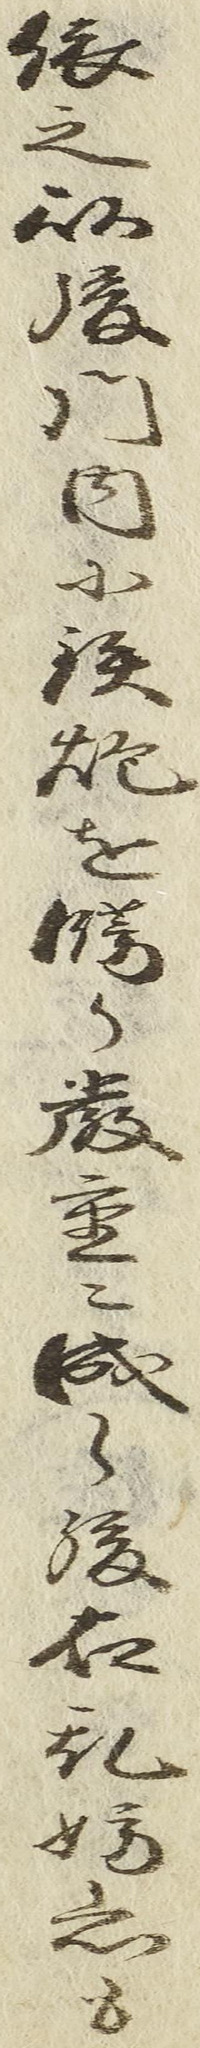依之以後門内に鉄炮を飾り厳重ニ成し後右乱妨者も
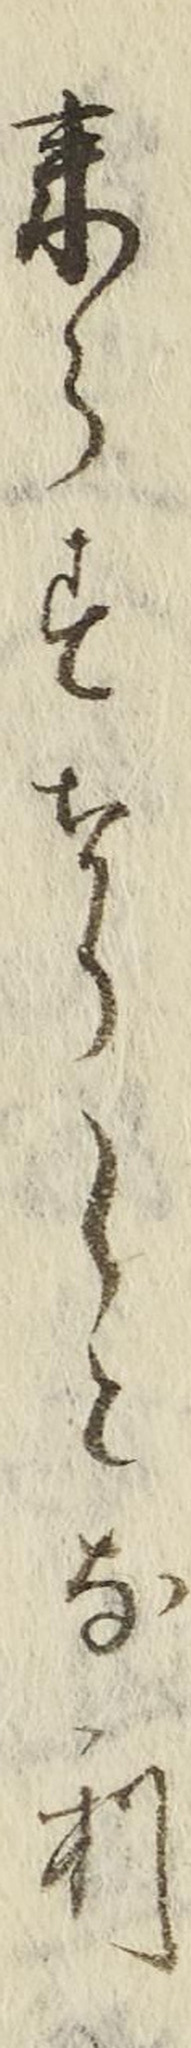来らすなりしとなり
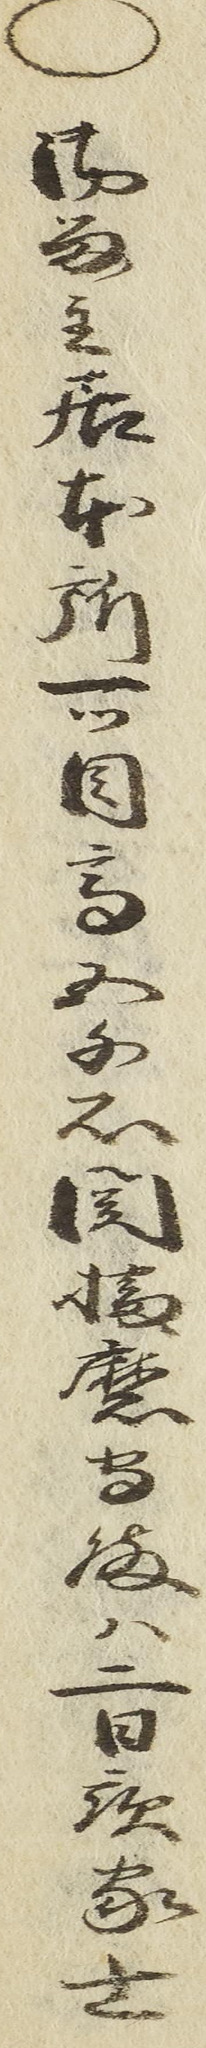○御留守居本所一ツ目高五千石関播磨守殿は二日夜家士

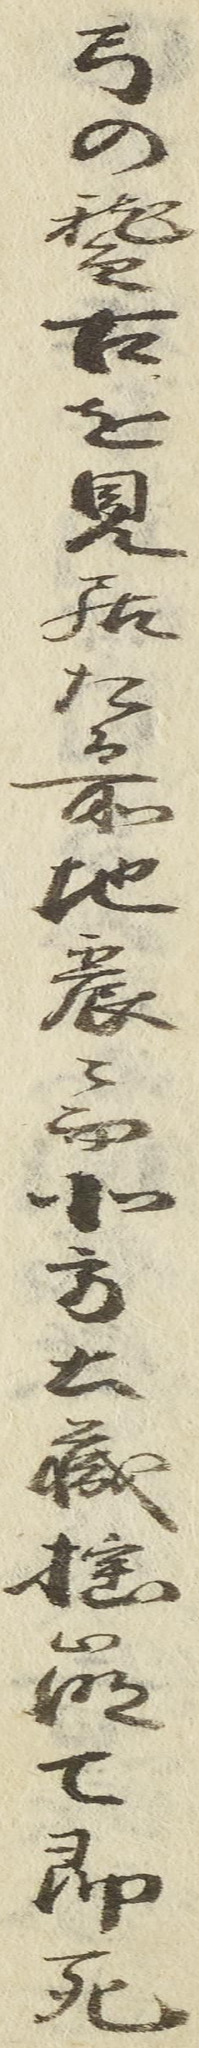弓の稽古を見居たる所地震二而北方土蔵揺崩て即死
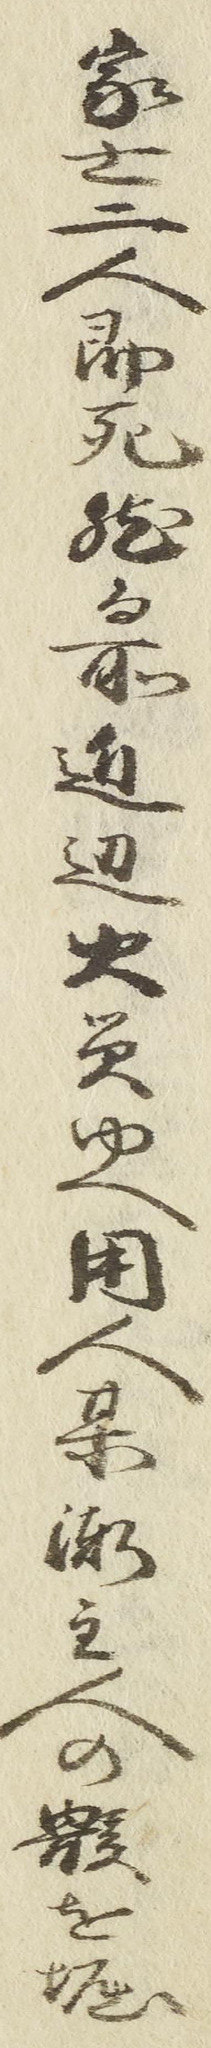家士二人即死然る所近辺火災ゆへ用人某漸主人の骸を掘
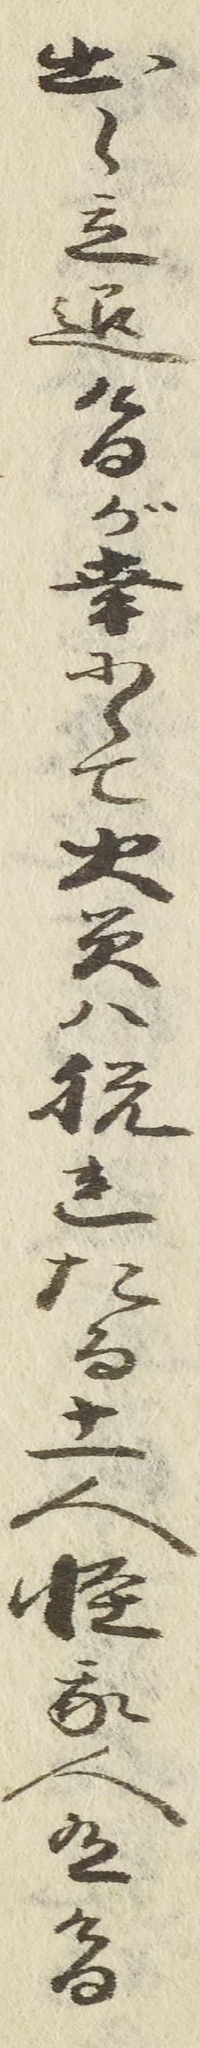出し立退けるが幸にして火災は脱れたる十一人怪我人有ける
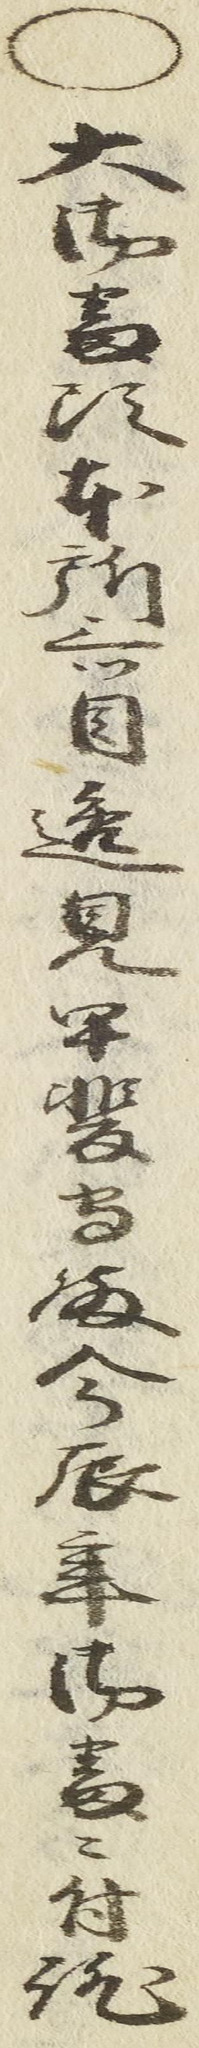○大御番頭本所三ツ目逸見甲斐守殿今辰年御番ニ付誂
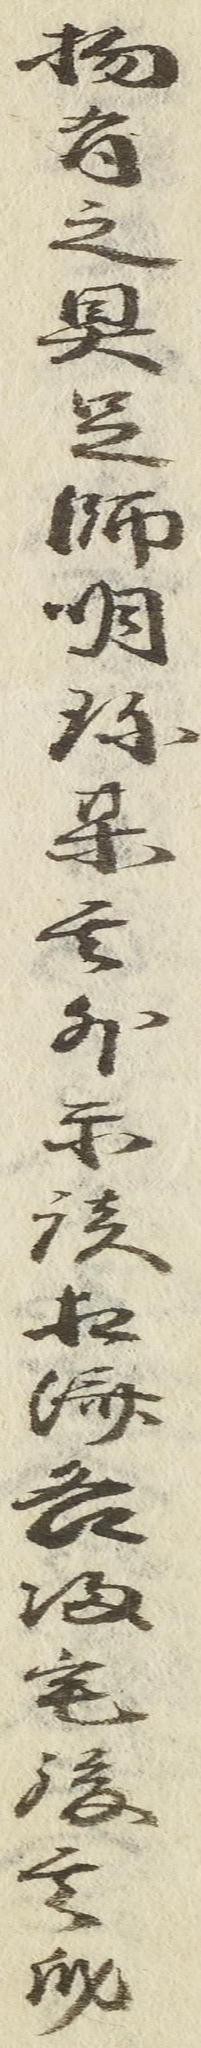物有之具足師明珍某其外示談相済各帰宅後其身
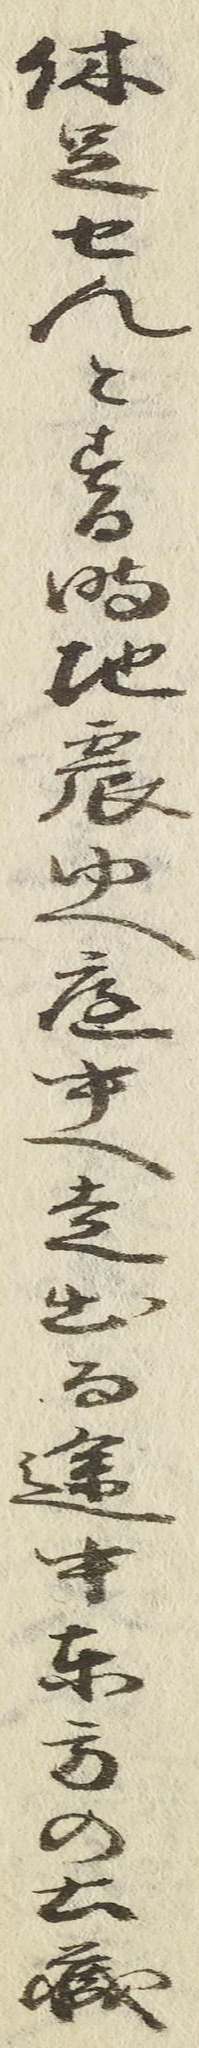休息せんとする時地震ゆへ庭中へ走出る途中東方の土蔵
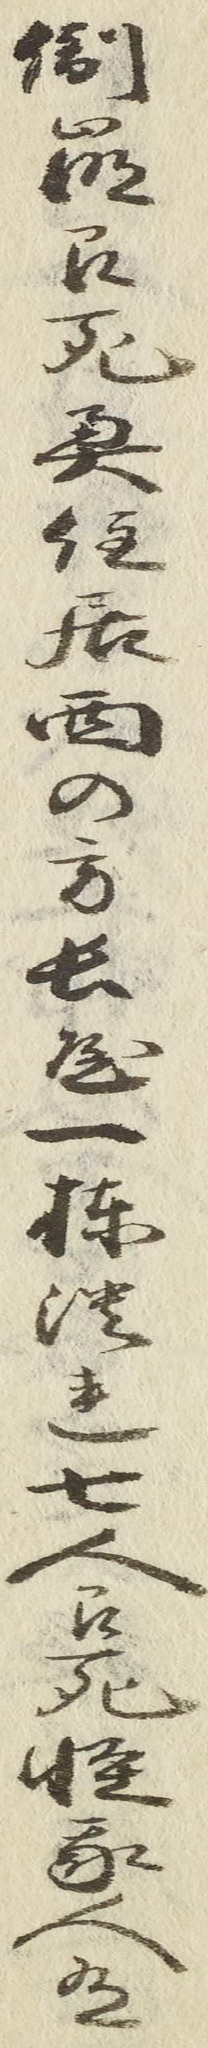倒崩即死奥住居西の方長屋一棟潰れ七人即死怪我人有
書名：安政二年震災記事　完
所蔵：東京大学地震研究所図書室 Earthquake Research Institute Library, The University of Tokyo, JAPAN
